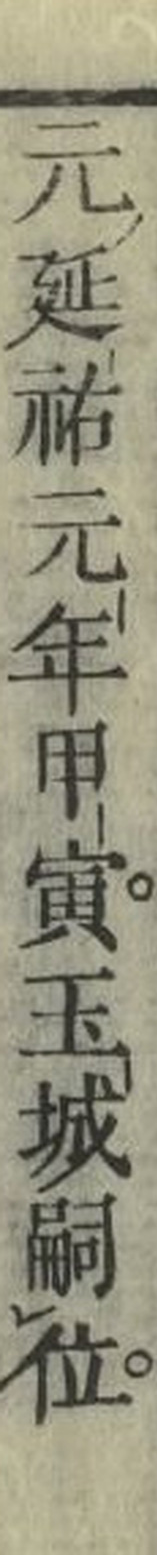元延-祐元-年甲-寅。玉-城嗣位。
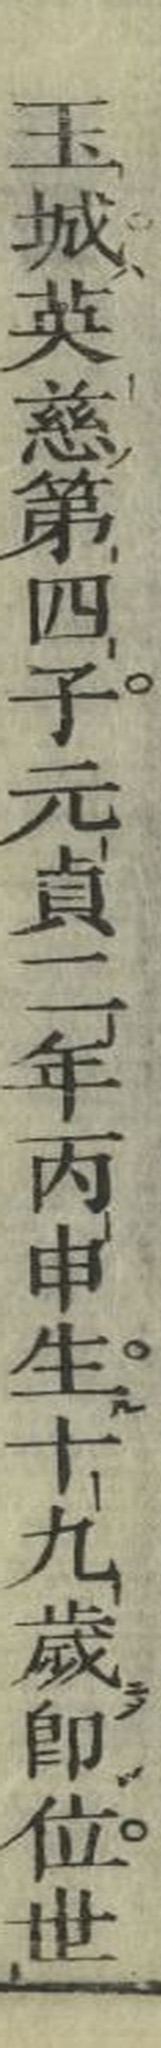玉城。英-慈第-四-子。元-貞二-年丙-申生。十-九-歳即位。世-
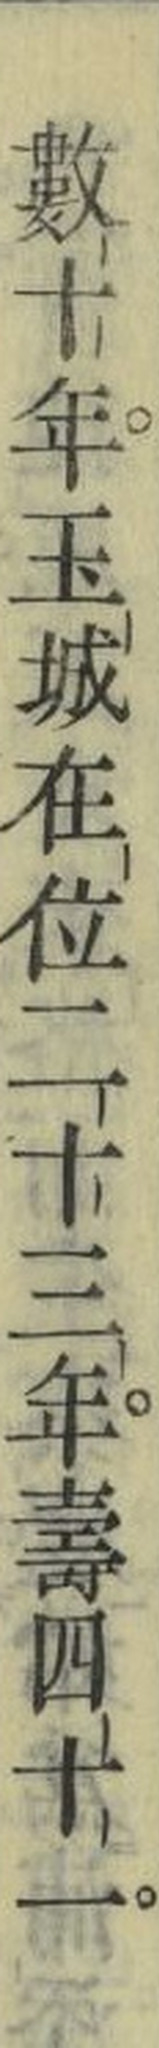数-十-年。玉-城在-位二-十-三-年。寿四-十-一。
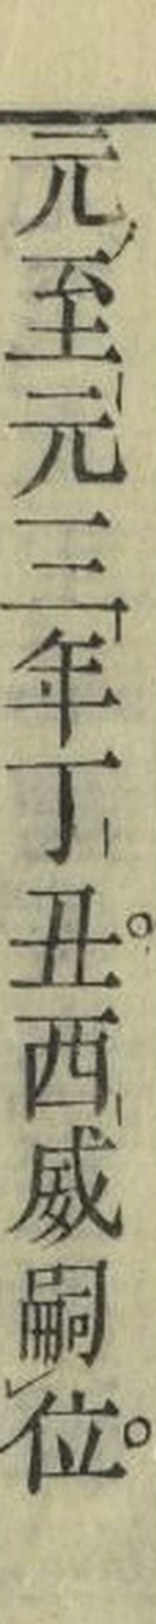元至-元三-年丁-丑。西-威嗣位。

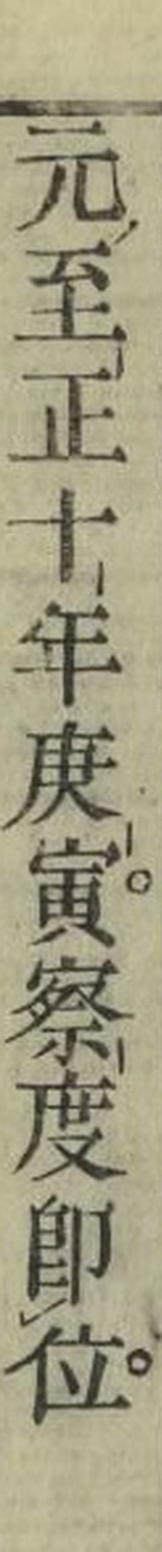元至-正十-年庚-寅。察-度即位。
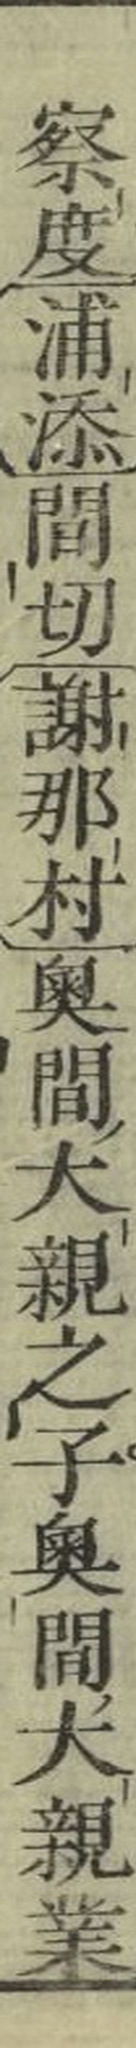察-度。[浦-添]間-切[謝-那-村]奥-間大-親之-子。奥-間大-親業

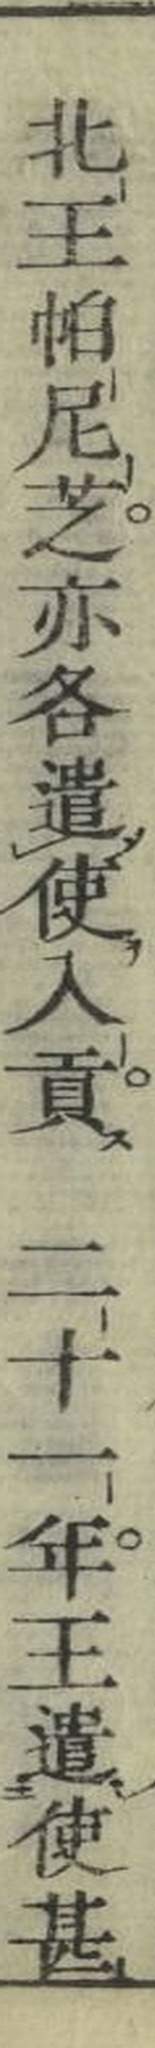北-王帕-尼-芝。亦各遣使入-貢。二-十一-年。王遣使甚-
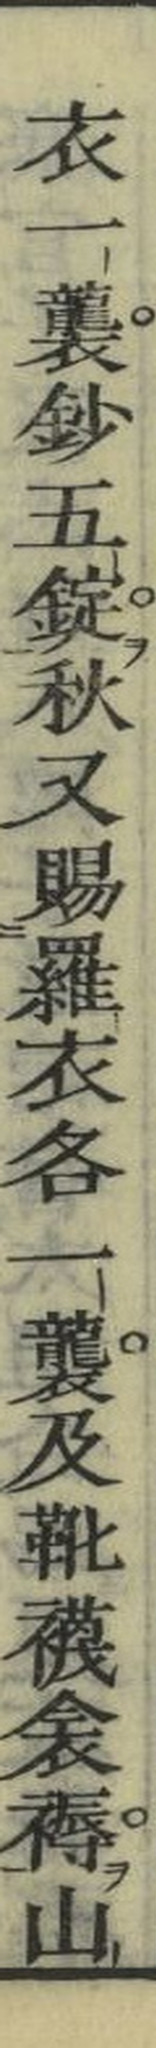衣一-襲。鈔五-錠。秋又賜羅-衣各一-襲。及靴襪衾褥。山-
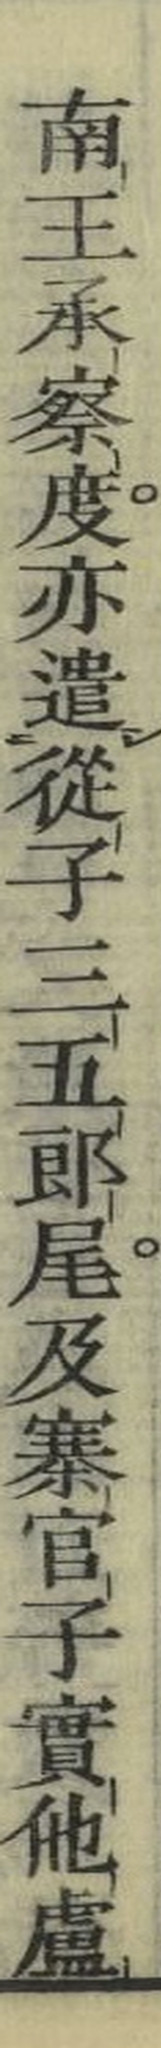南-王承-察-度。亦遣従-子三-五-郎-尾。及寨-官-子実-他-盧-

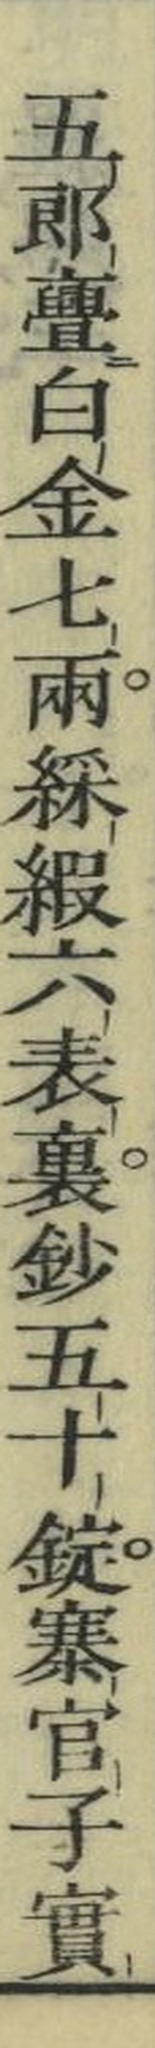五-郎-亹白-金七-両。綵-緞六-表-裏。鈔五-十-錠。寨-官-子実-

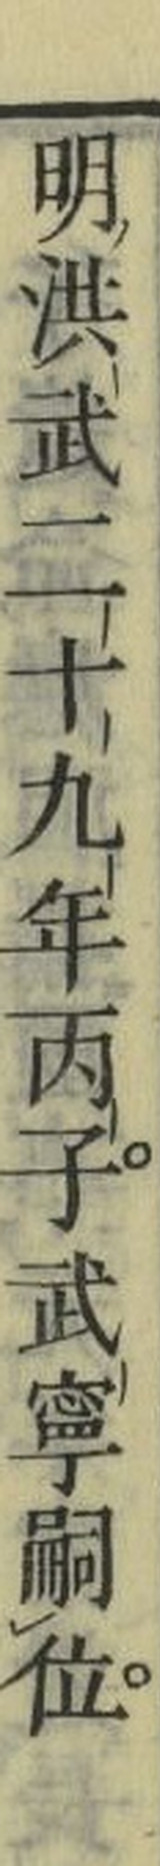明洪-武二-十-九-年丙-子。武-寧嗣位。

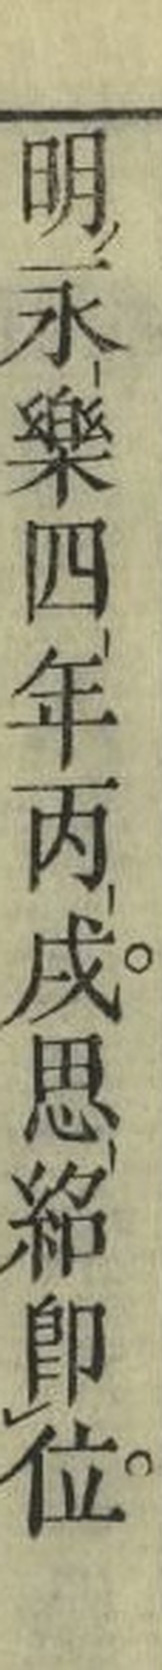明永-楽四-年丙-戌。思-紹即位。

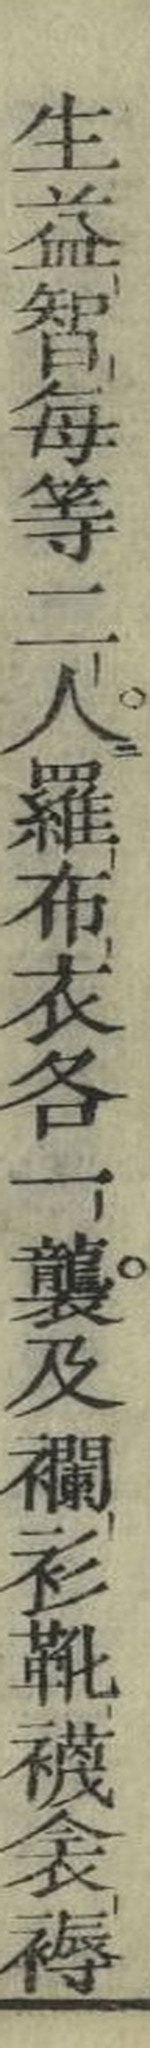生益-智-毎等二-人。羅-布-衣各一-襲。及襴-衫靴-襪衾-褥

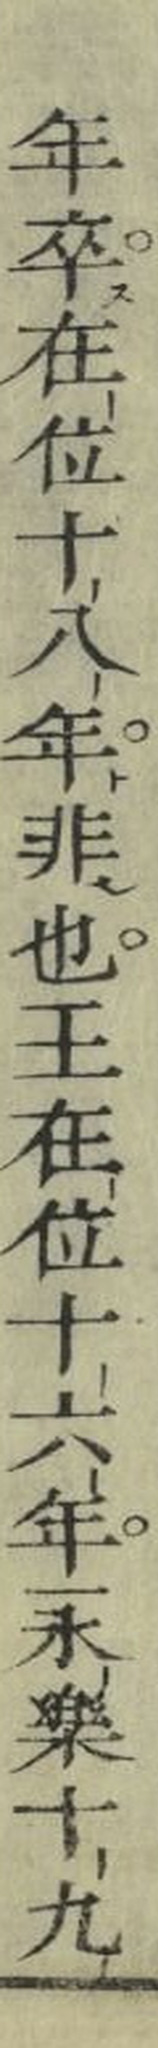年卒。在-位十-八-年。非也。王在-位十-六-年。永-楽十-九-
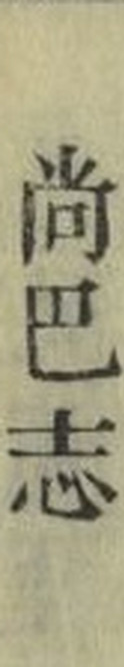尚巴志
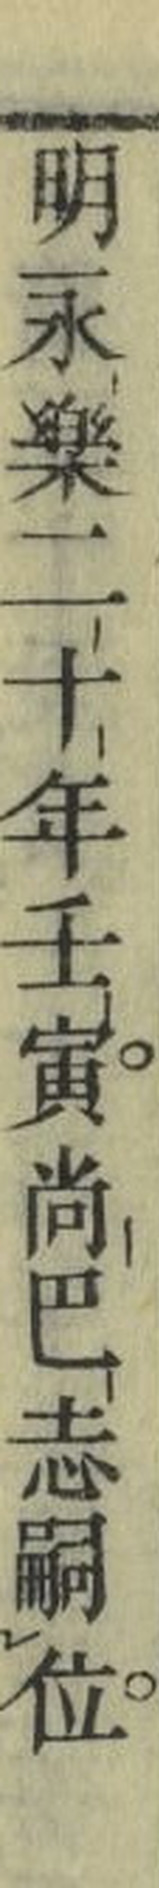明永-楽二-十-年壬-寅。尚-巴-志嗣位。
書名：中山伝信録 巻三
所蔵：University of the Ryukyus Library
